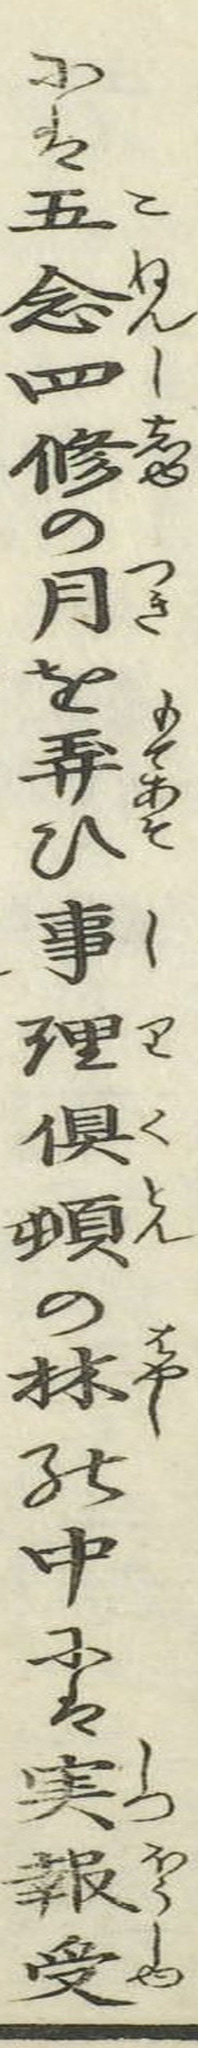には五念四修の月を弄ひ事理俱頓の林の中には実報受
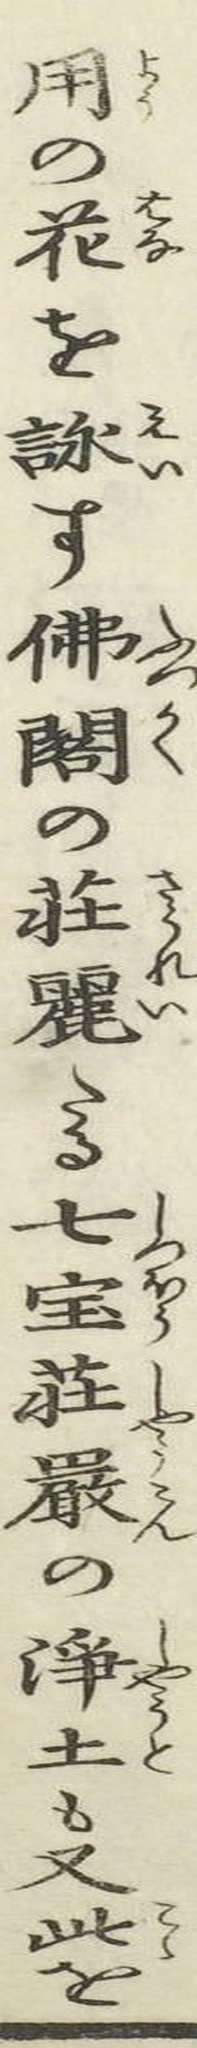用の花を詠す佛閣の荘麗たる七宝荘厳の浄土も又此を
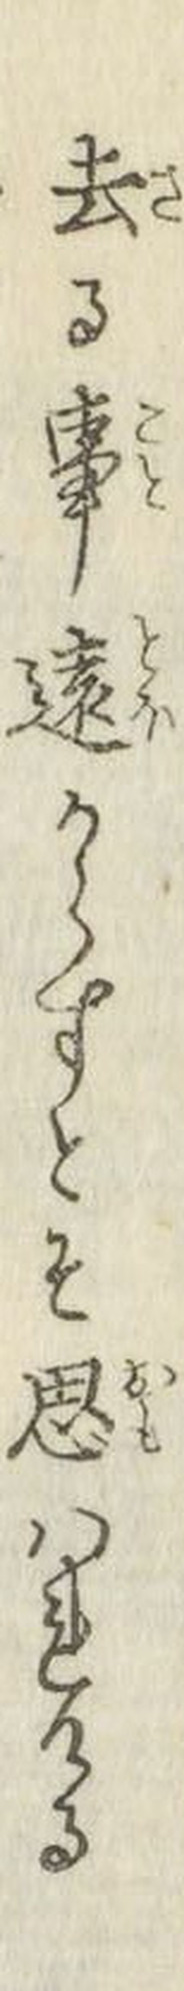去る事遠からすとそ思はれける
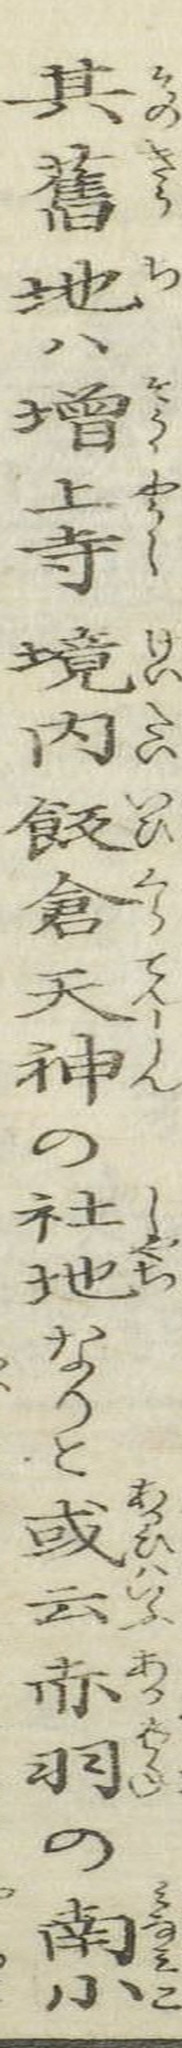其舊地は増上寺境内飯倉天神の社地なりと或云赤羽の南小
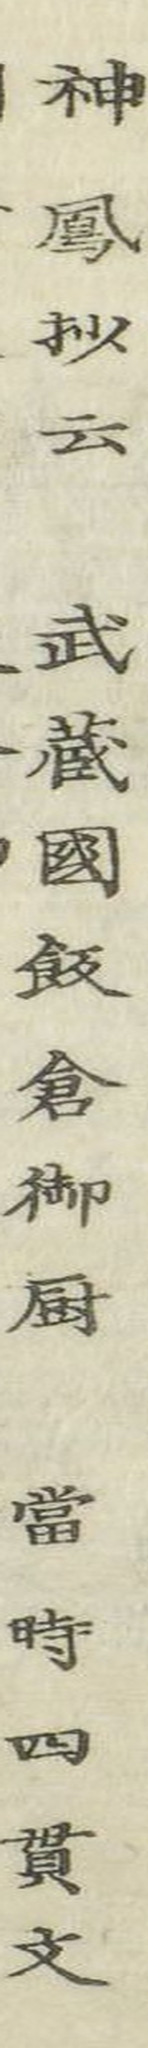神鳳抄云武蔵國飯倉御厨當時四貫文
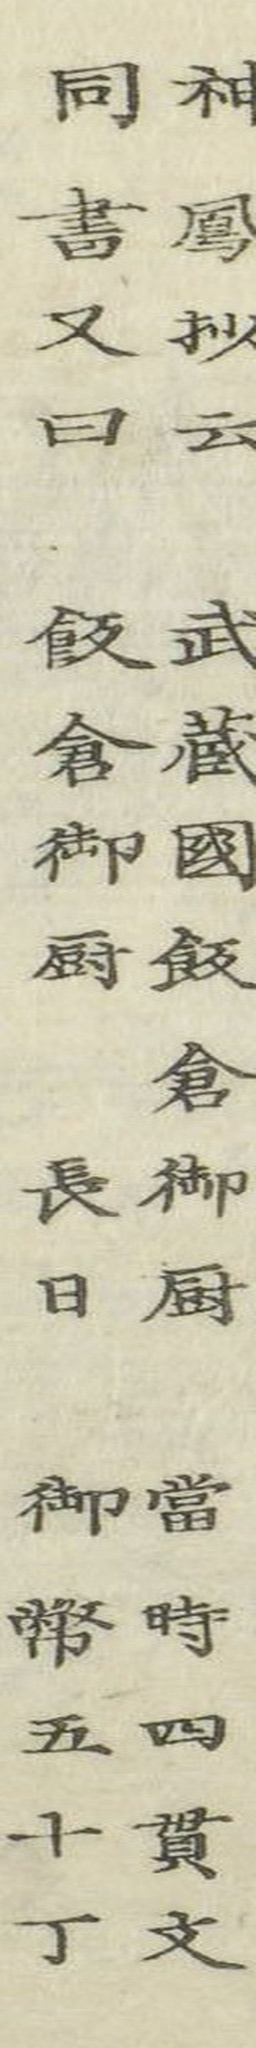同書又曰飯倉御厨長日御幣五十丁
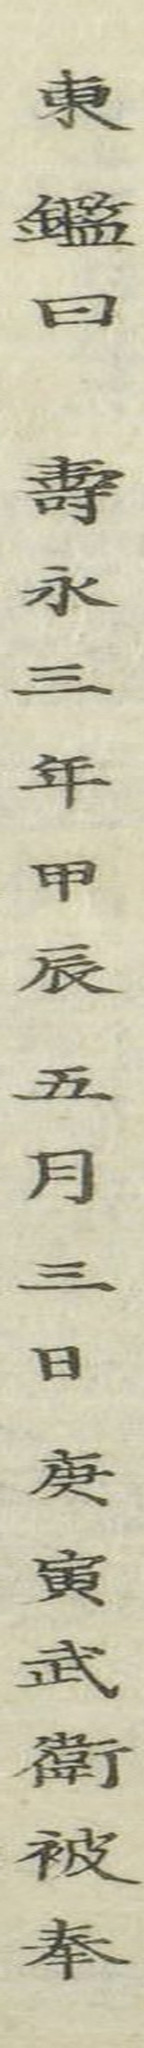東鑑曰寿永三年甲辰五月三日庚寅武衛被奉
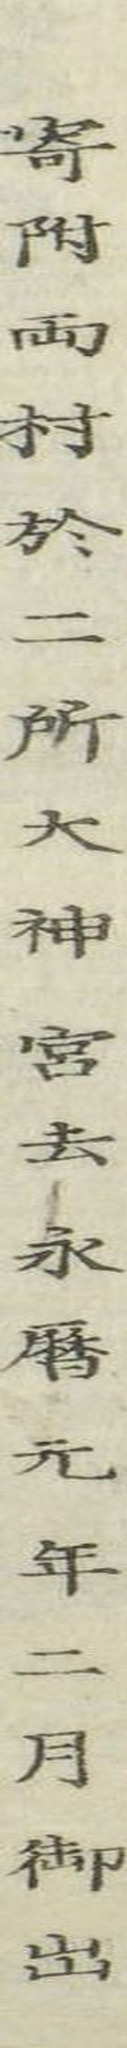寄附両村於二所大神宮去永暦元年二月御出
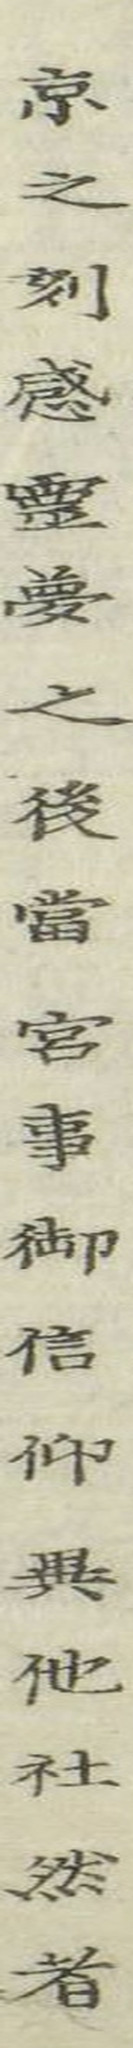京之刻感霊夢之後當宮事御信仰異他社然者
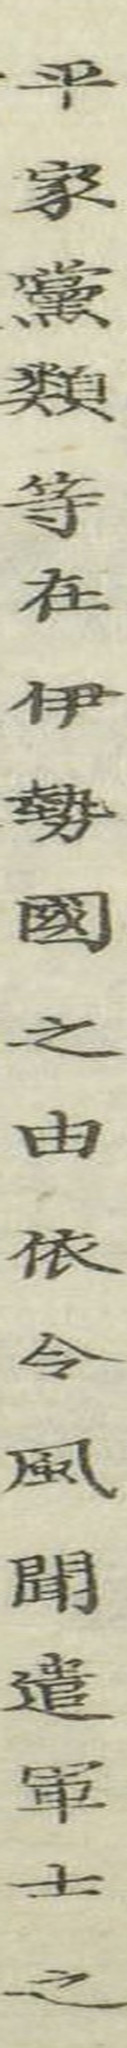平家党類等在伊勢國之由依令風聞遣軍士之
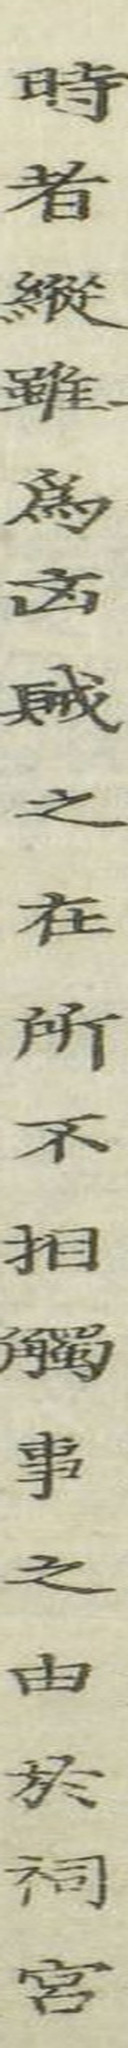時者縦雖為凶賊之在所不相触事之由於祠宮
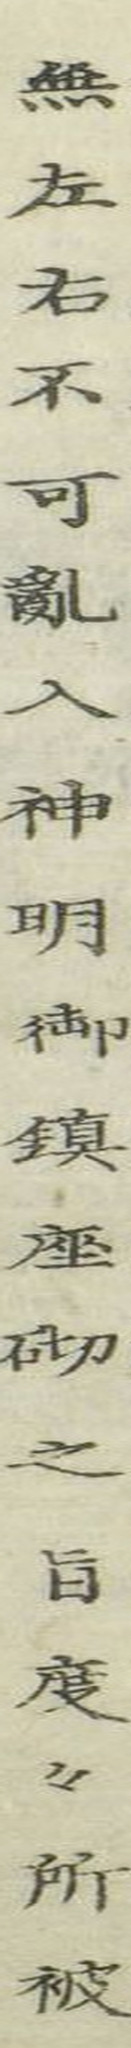無左右不可乱入神明御鎮座砌之旨度々所被
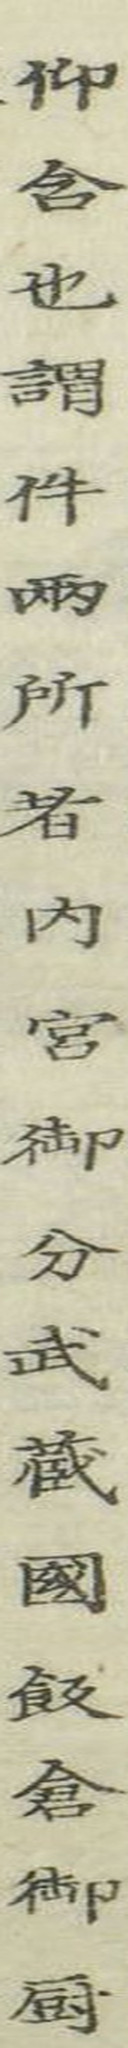仰含也謂件両所者内宮御分武蔵國飯倉御厨
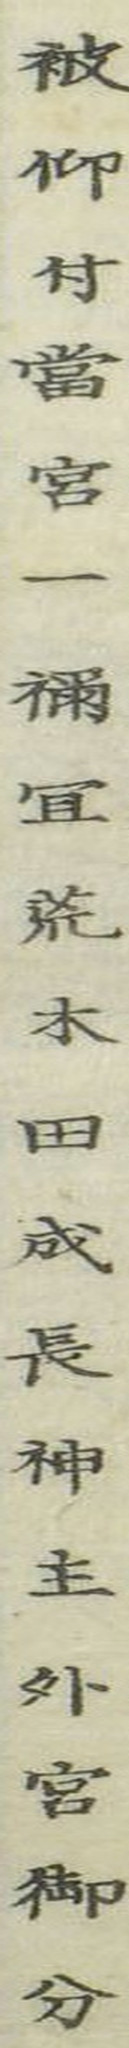被仰付當宮一祢宜荒木田成長神主外宮御分

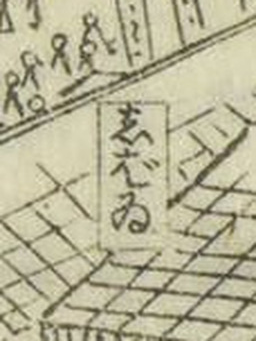しばゐ
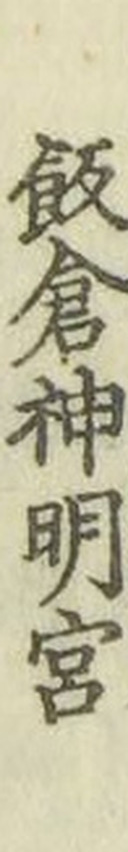飯倉神明宮
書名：江戸名所図会 20巻 巻之3
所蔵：東京学芸大学教育コンテンツアーカイブ
